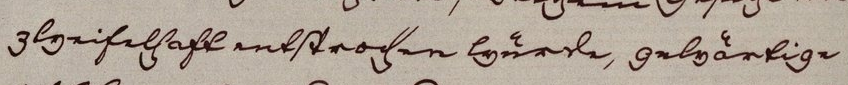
zweifelhaft entsprochen würde, gewärtige
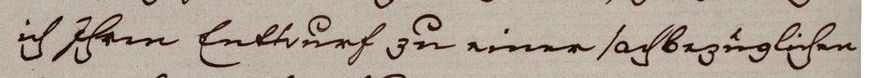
ich Ihren Entwurf zu einer sachbezüglichen
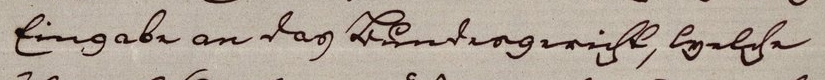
Eingabe an das Bundesgericht, welche
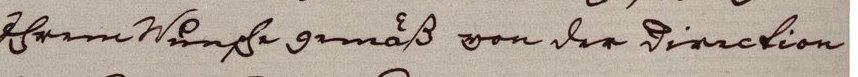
Ihrem Wunsche gemäß von der Direction
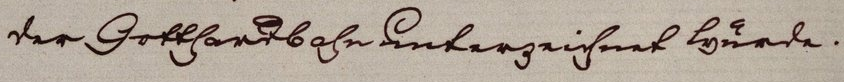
der Gotthardbahn unterzeichnet würde.
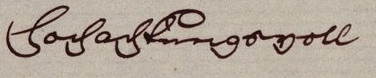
Hochachtungsvoll
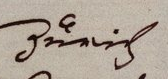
Zürich
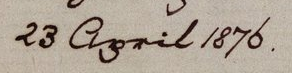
23 April 1876.
